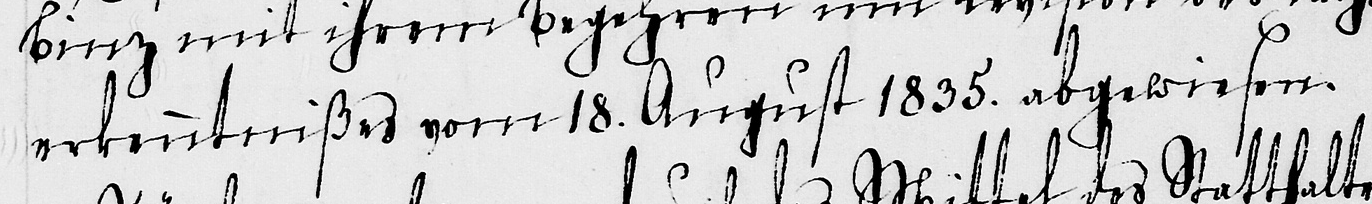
erkenntnißes vom 18. August 1835. abgewiesen.
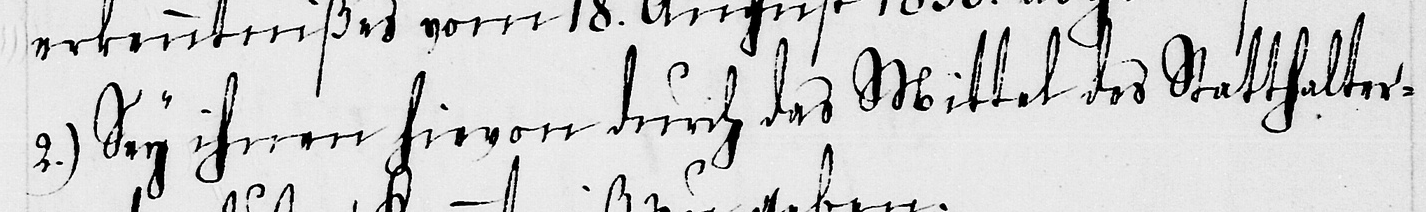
2.) Sey ihnen hievon durch das Mittel des Statthalte¬
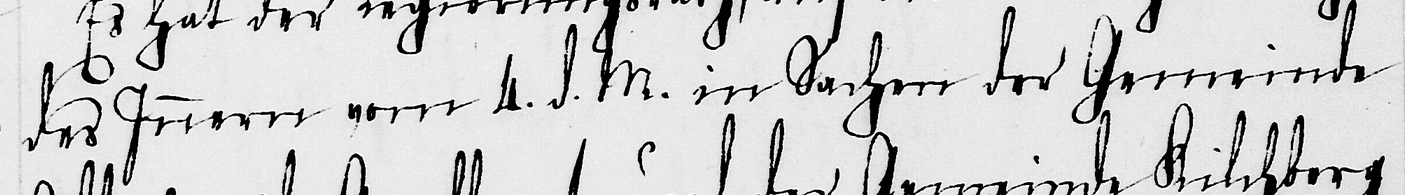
des Innern vom 4. d. M. in Sachen der Gemeinde
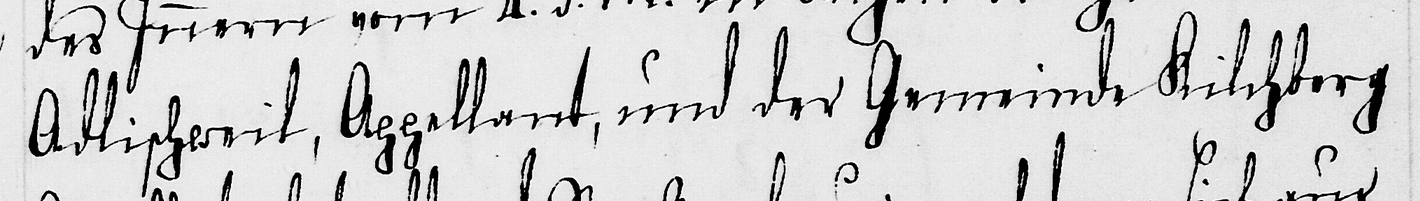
Adlischweil, Appellant, und der Gemeinde Kilchberg
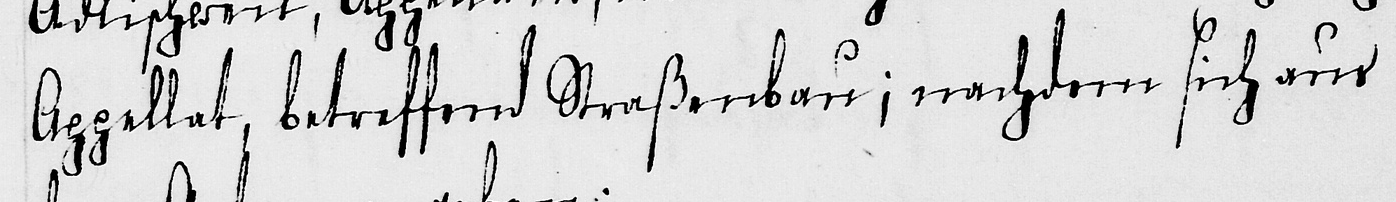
Appellat, betreffend Straßenbau; nachdem sich aus
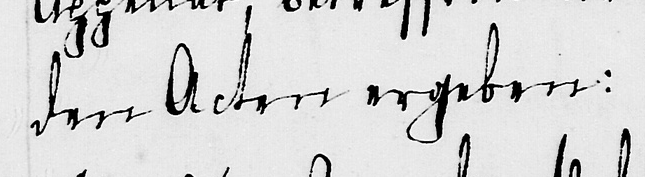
den Acten ergeben:
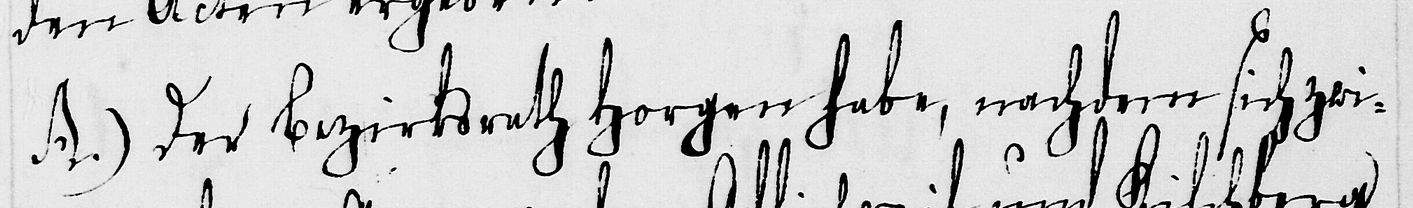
A.) Der Bezirksrath Horgen habe, nachdem sich zwi¬
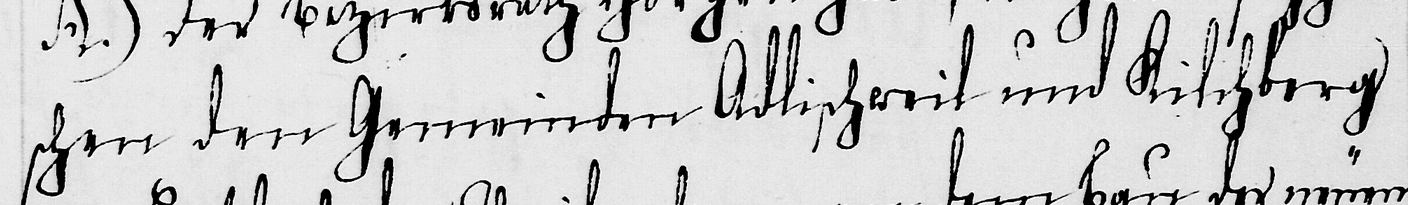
schen den Gemeinden Adlischweil und Kilchberg
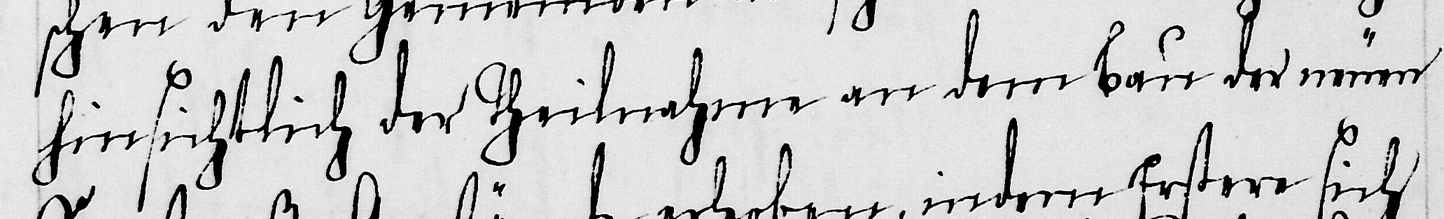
hinsichtlich der Theilnahme an dem Bau der neuen
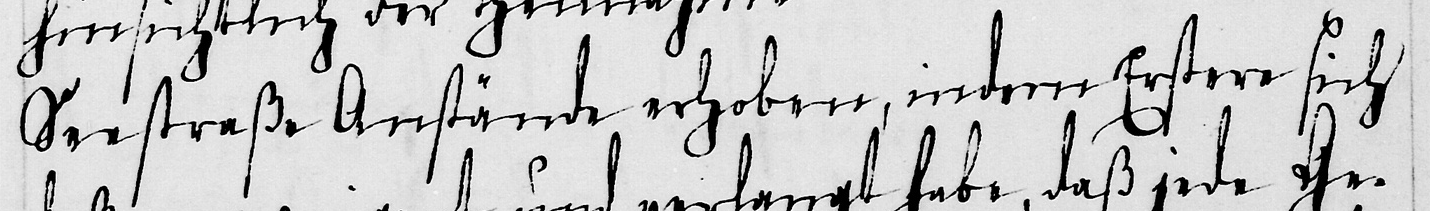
Seestraße Anstände erhoben, indem Erstere sich
